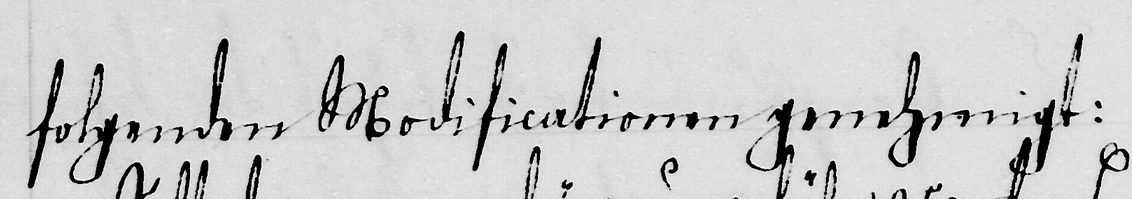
folgenden Modificationen genehmigt:
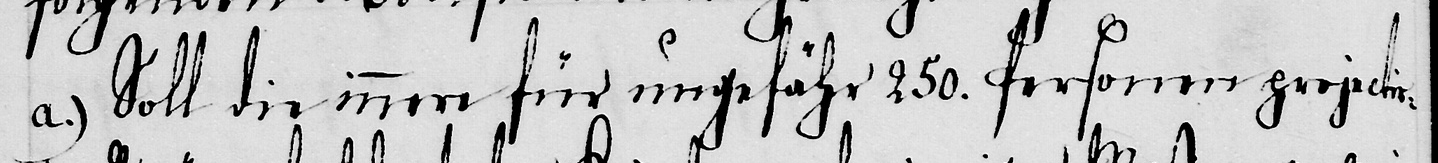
a.) Soll die innere für ungefähr 250. Personen projecti¬
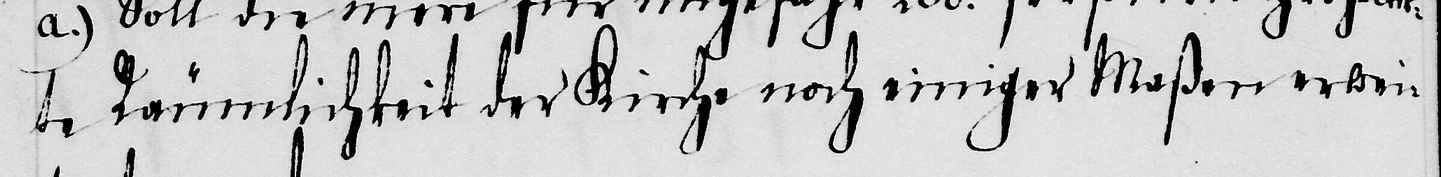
rte Räumlichkeit der Kirche noch einiger Maßen erwei¬
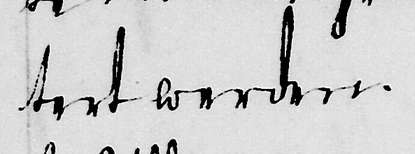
tert werden.
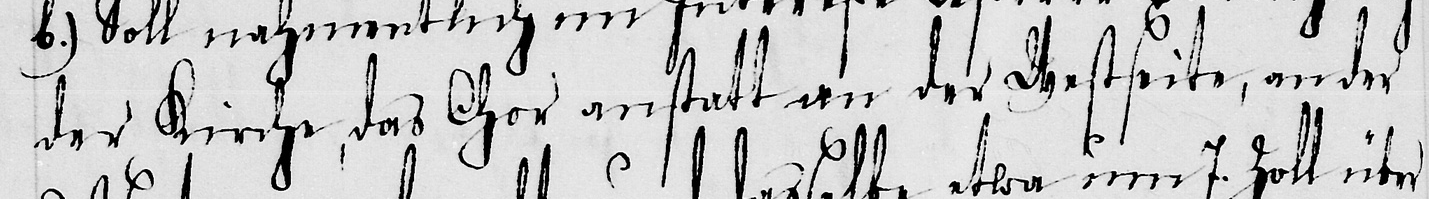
der Kirche, das Chor anstatt an der Westseite, an der
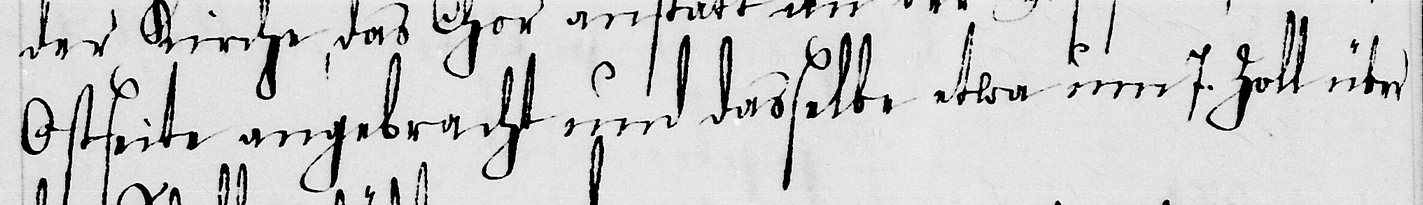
Ostseite angebracht und dasselbe etwa um 7. Zoll über
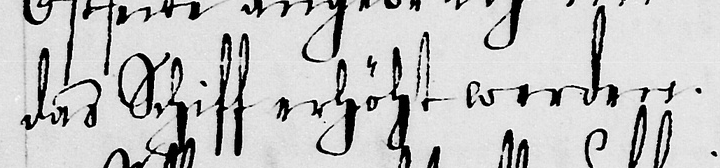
das Schiff erhöht werden.
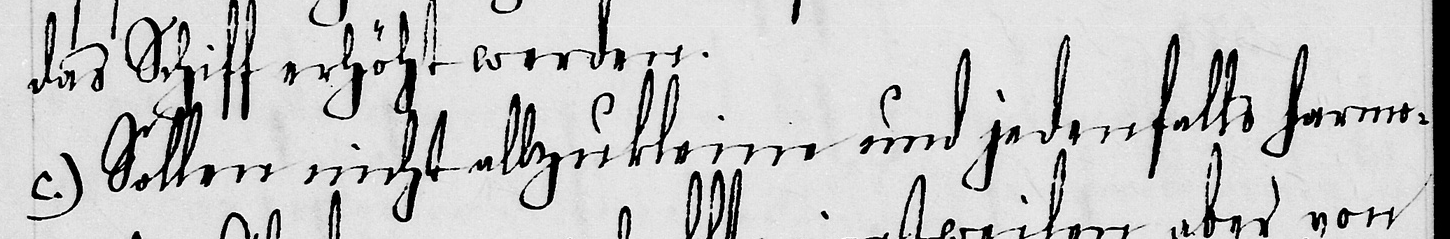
c.) Sollen nicht allzukleine und jedenfalls harm¬
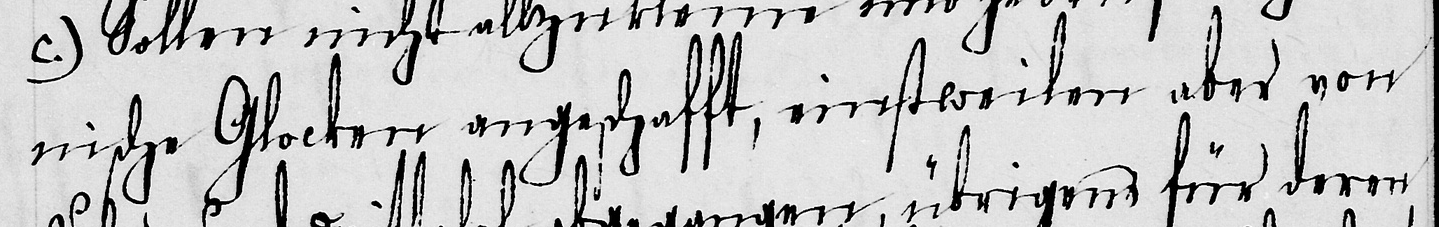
onische Glocken angeschafft, einstweilen aber von
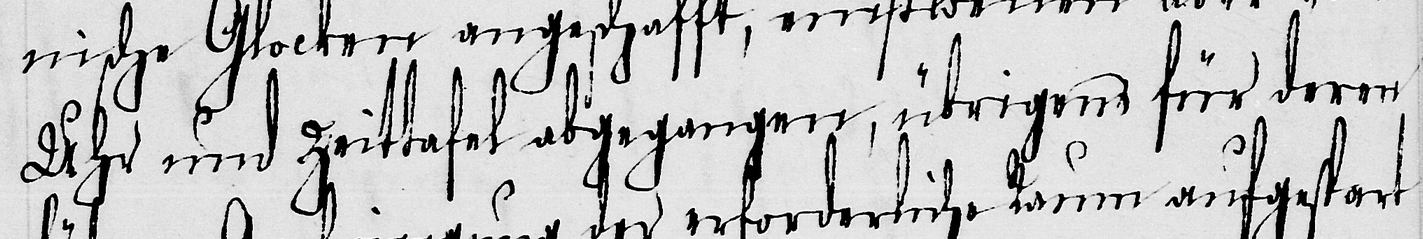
Uhr und Zeittafel abgegangen, übrigens für deren
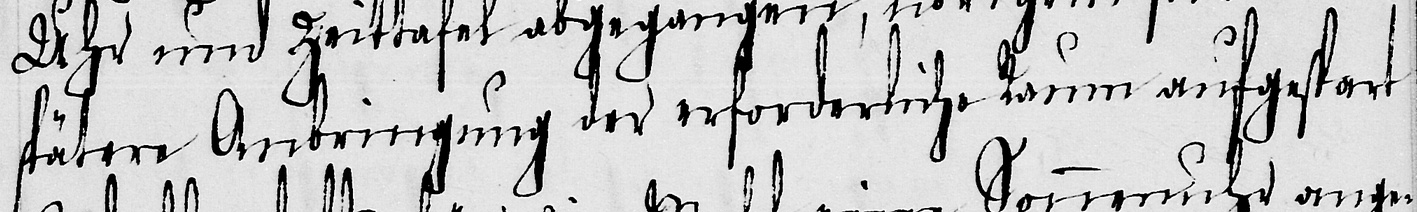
spätere Anbringung der erforderliche Raum aufgespart
